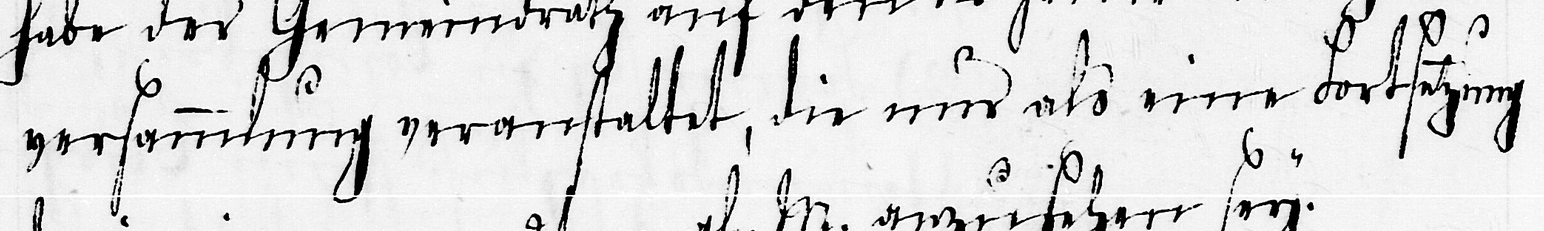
versammlung veranstaltet, die nur als eine Fortsetzung
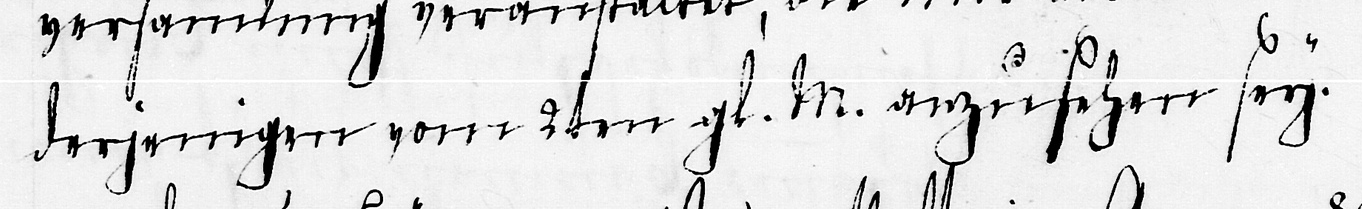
derjenigen vom 2ten gl. M. anzusehen sey.
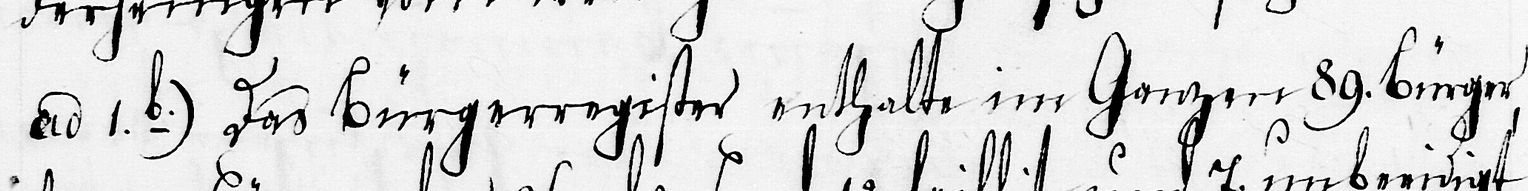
ad 1.b) Das Bürgerregister enthalte im Ganzen 89. Bürger,
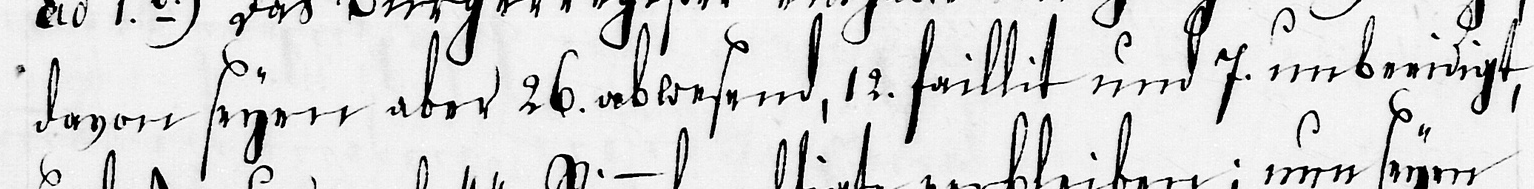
davon seyen aber 26. abwesend, 12. faillit und 7. unbeeidigt,
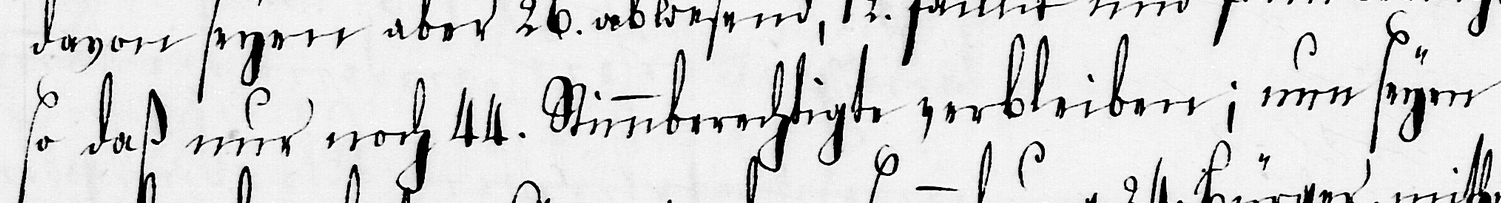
so daß nur noch 44. Stimmberechtigte verbleiben; nun seyen
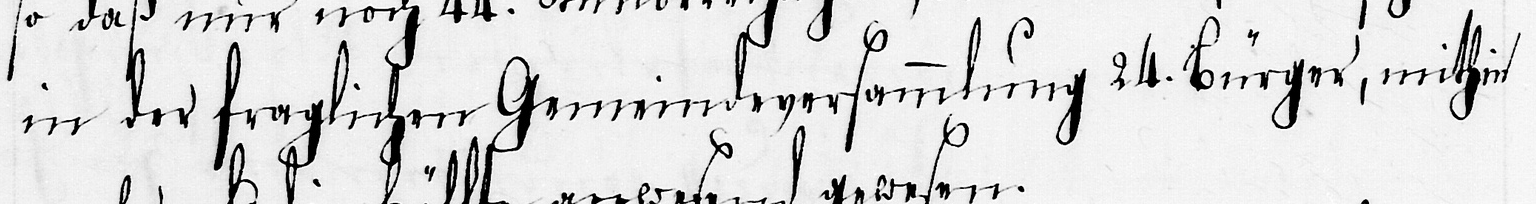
in der fraglichen Gemeindeversammlung 24. Bürger, mithin
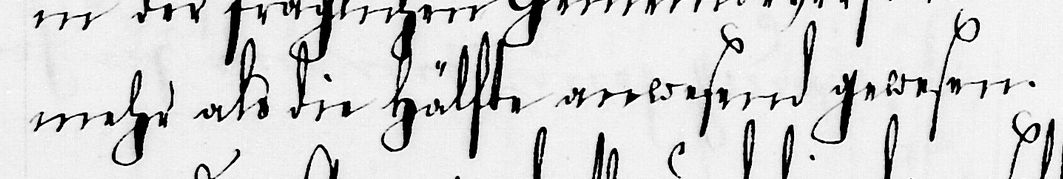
mehr als die Hälfte anwesend gewesen.
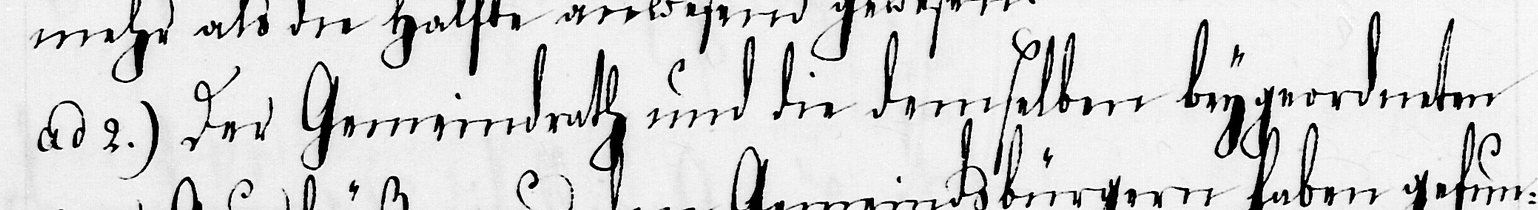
ad 2.) Der Gemeindrath und die demselben beygeordneten
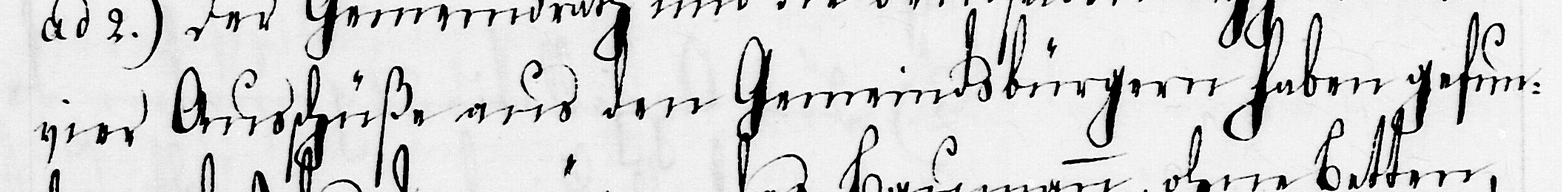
vier Ausschüße aus den Gemeindsbürgern haben gefun¬
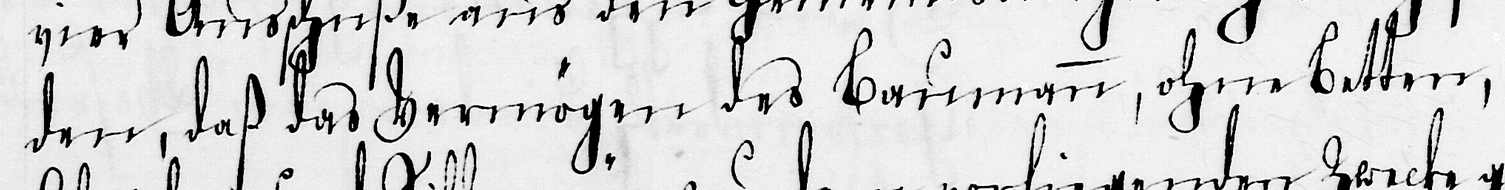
den, daß das Vermögen des Baumann, ohne Betten,
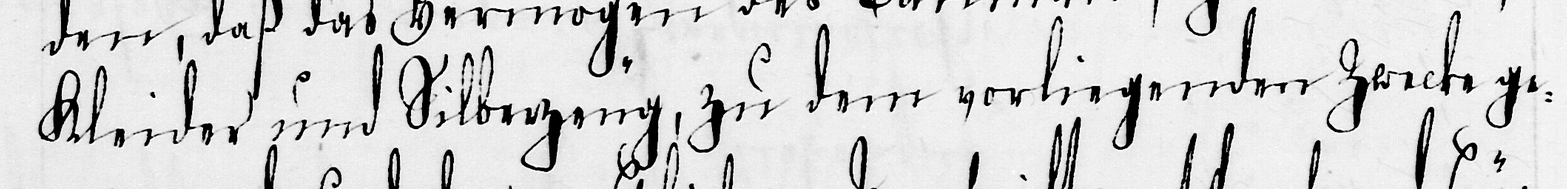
Kleider und Silberzeug, zu dem vorliegenden Zwecke ge¬
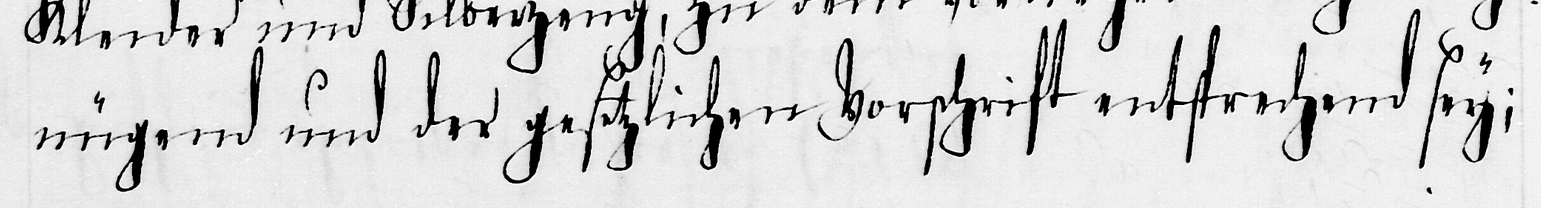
nügend und der gesetzlichen Vorschrift entsprechend sey;
